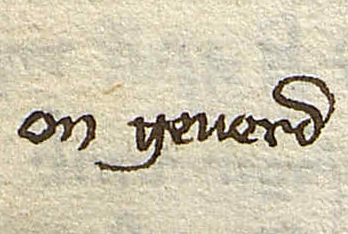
on geuerd
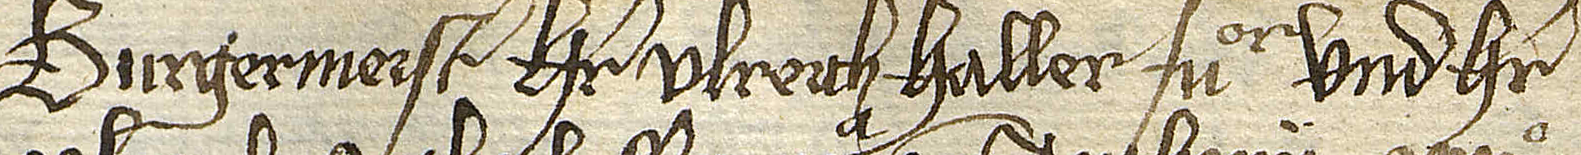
Burgermeiſt* Hr* vlreich haller Iu* Vnd hr*
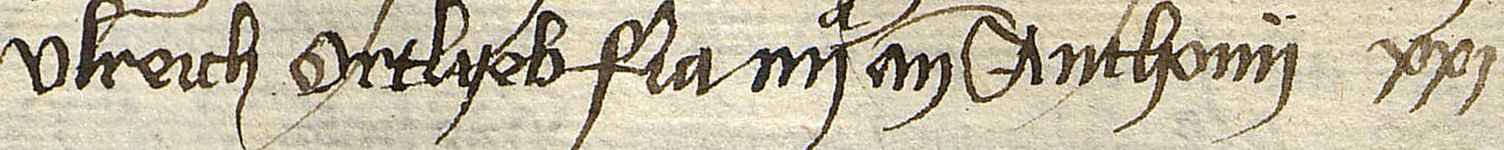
vlreich Ortlieb fi*a iiii* an* Anthonii xxi*
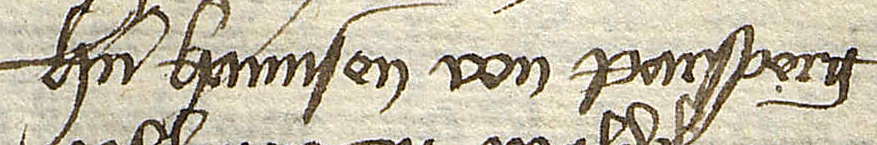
Hn* hannſen von Parſperg
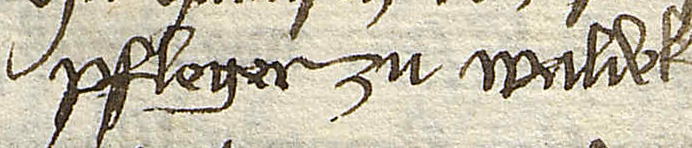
pfleger ʒu waldek
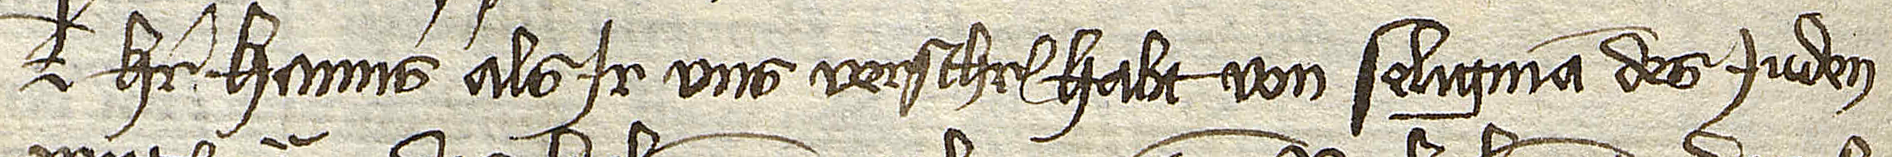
L* hr* hanns als Ir vns verſchr* habt von ſeligma* des Iuden
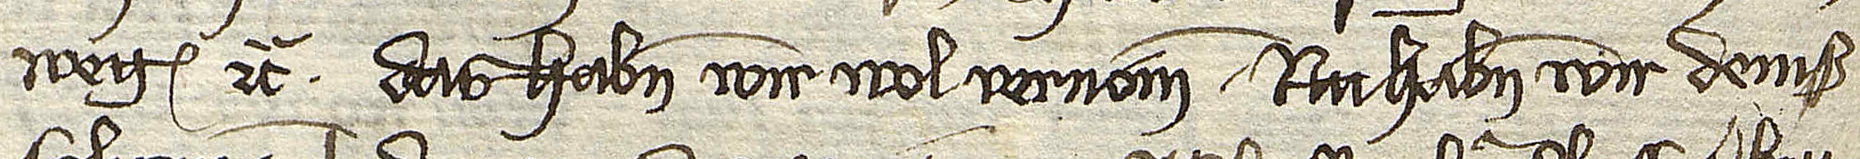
weg* ec* . Das habn* wir wol vernom* / Nu habn* wir demſ*
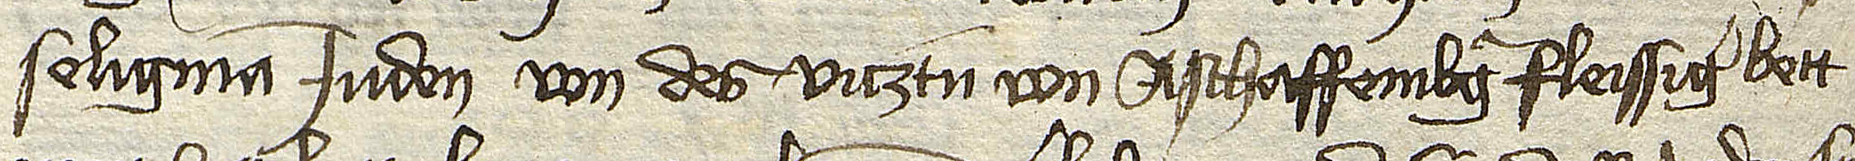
ſeligma* Iuden von des vicʒtu* von Aſchaffemb*g fleiſſig* bett
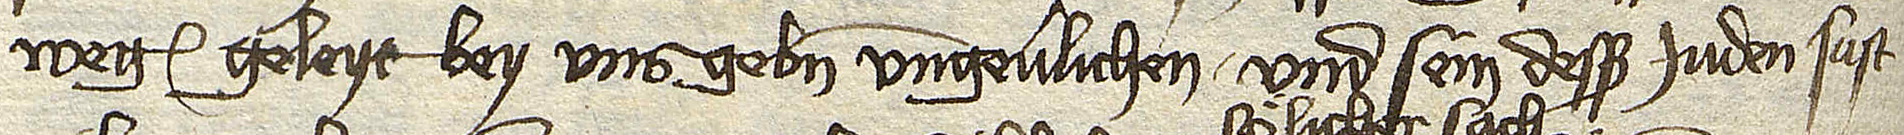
weg* geleyt bey vns gebn* vngeu*lichen / vnd ſein deſſ* Iuden ſuſt
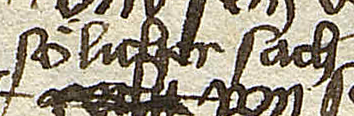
ſölicher ſach
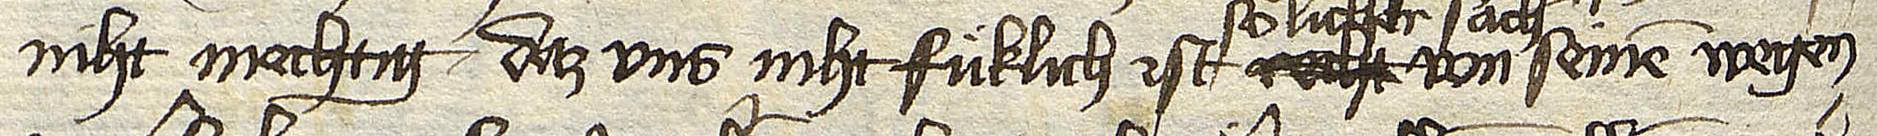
niht mechtig / Daʒ vns niht füklich iſt recht von ſeine* wegen
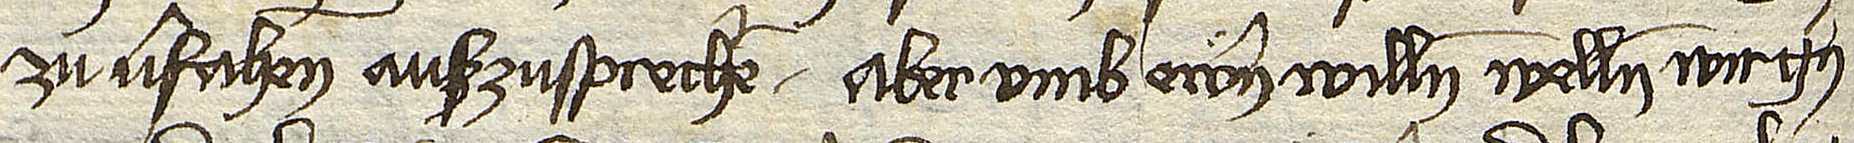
ʒu u*fahen auſʒʒuſpreche* / aber vmb eẅ*n willn* welln* wir g*n
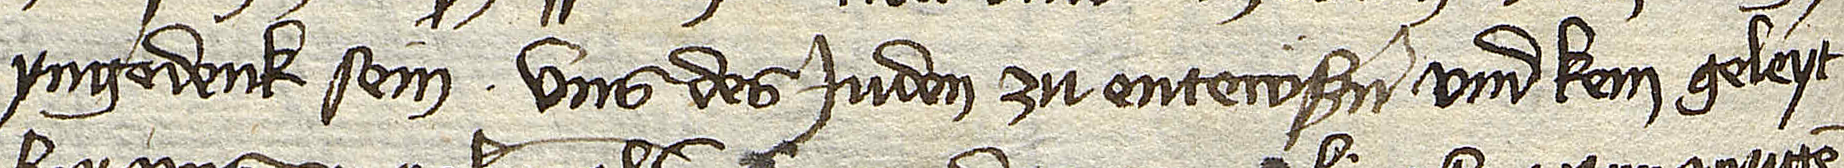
yngedenk ſein . Vns des Iuden ʒu enteẅſʒn* vnd kein geleyt
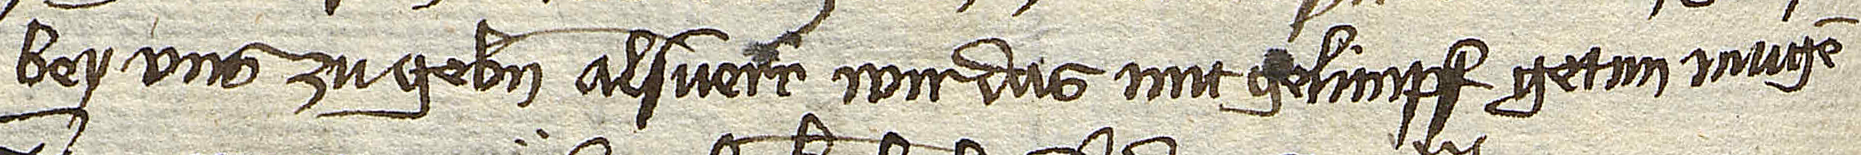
bey vns ʒu gebn* alſuerr wir das mit gelimpf getun muge*
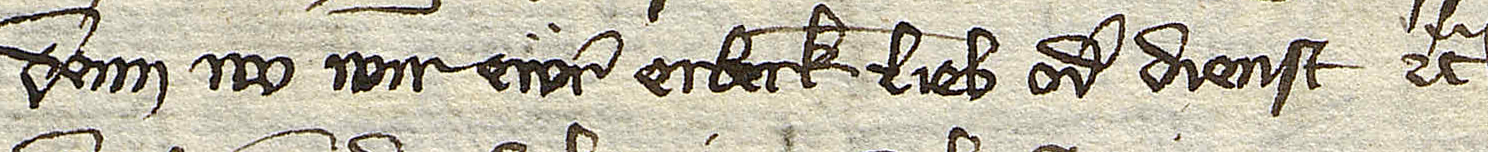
Denn wo wir eẅr* erberk* lieb od* dienſt ec*
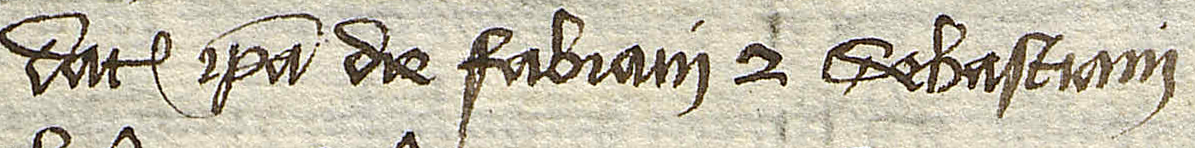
Dat* ipa* die fabiani @ Sebaſtiani
